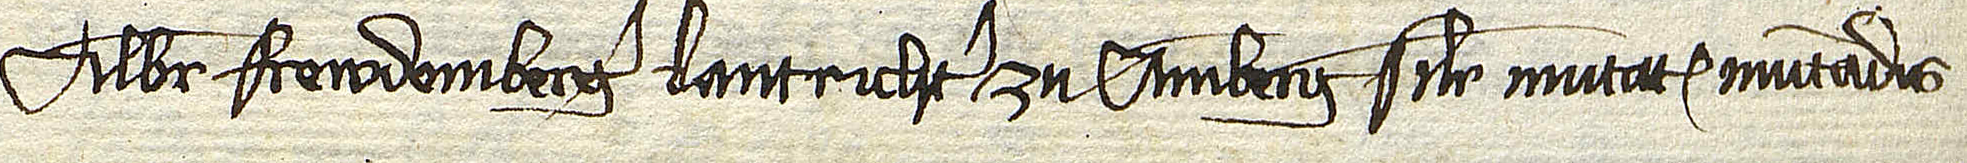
Albr* frewdemberg* lantricht* cʒu Amberg* ſilr* mutat* muta*dis
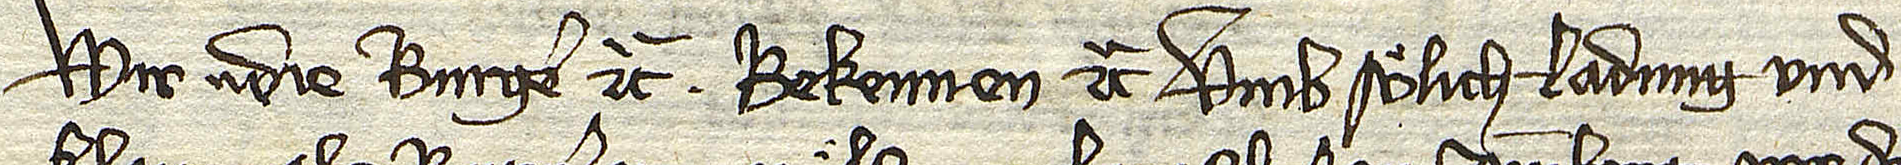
Wir ~ die Burge* ec* . Bekennen ec* Vmb ſölich ladung vnd
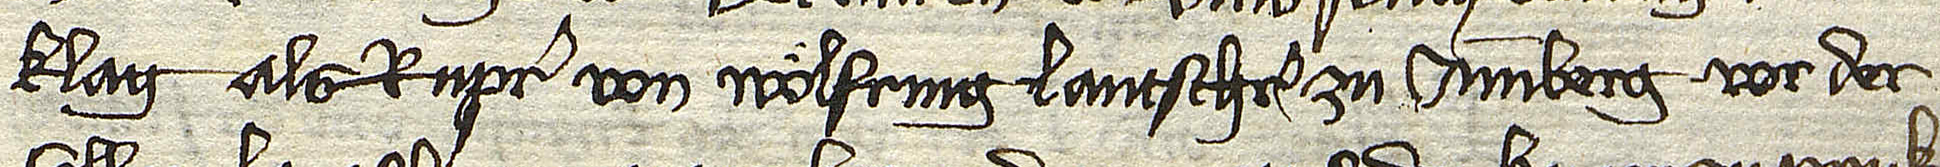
klag als Rupre* von wölfring lantschr* cʒu Am*berg vor der
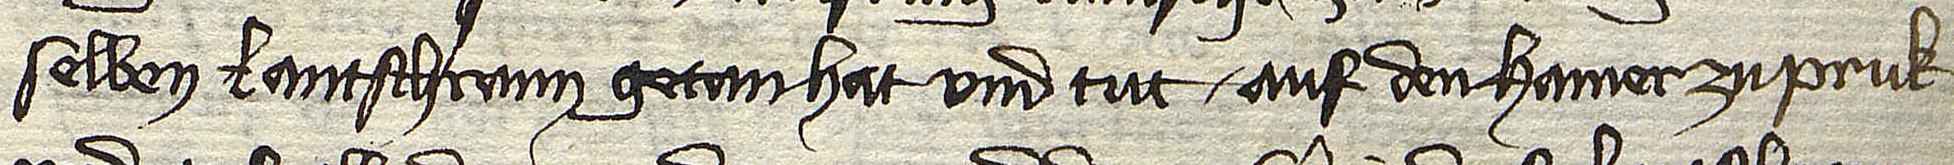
ſelben lantſchrann getan hat vnd tut / auf den Hamer ʒu Pruk
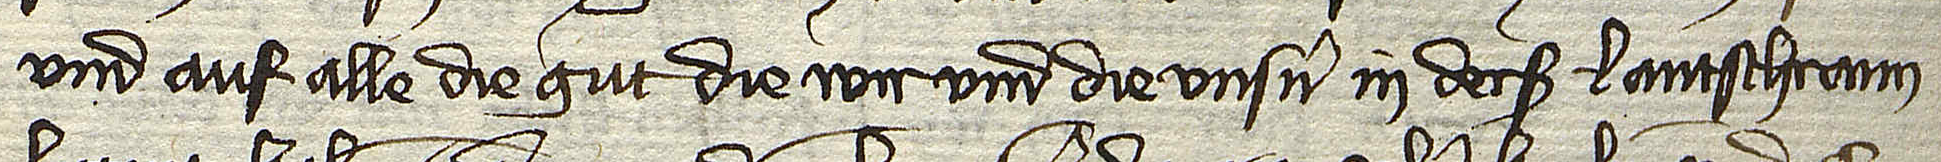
vnd auf alle die gut die wir vnd die vnſn* in derſ* lantſchrann
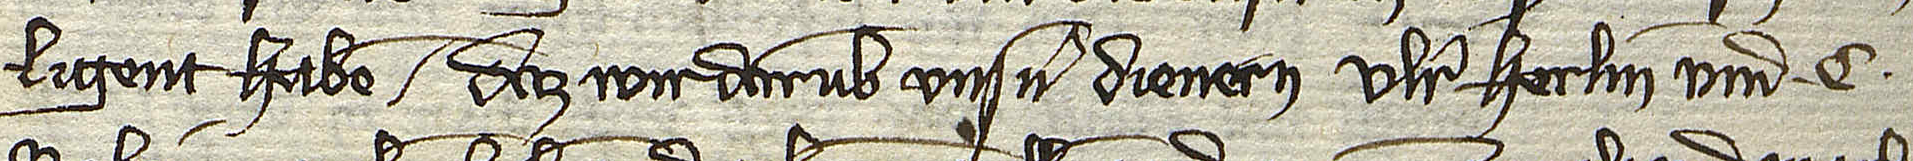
ligent habe* / Daʒ wir darub* vnſn* dienern vlr* Herlin vnd C .
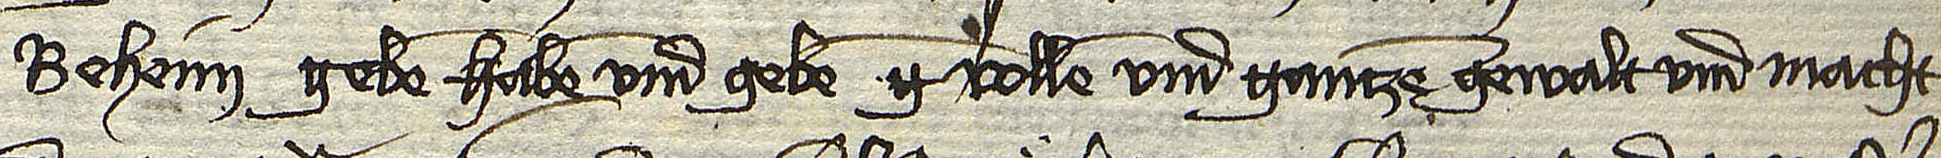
Beheim gebe* habe* vnd gebe* g volle* vnd gancʒe* gewalt vnd macht
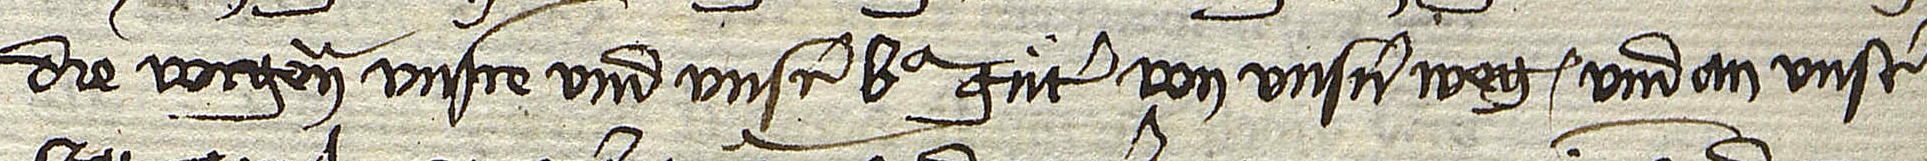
die vorgen* vnſre nd vnſr* b* güt* von vnſn* weg* vnd an vnſr*
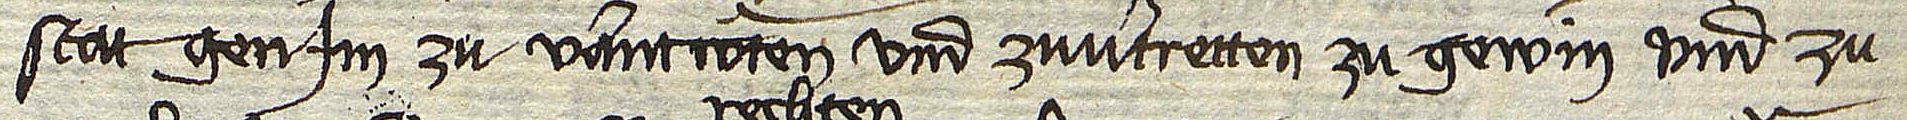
ſtat gen Im ʒu v*antw*ten vnd ʒuu*tretten ʒu gewin* vnd ʒu
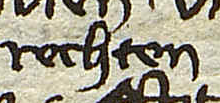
rechten
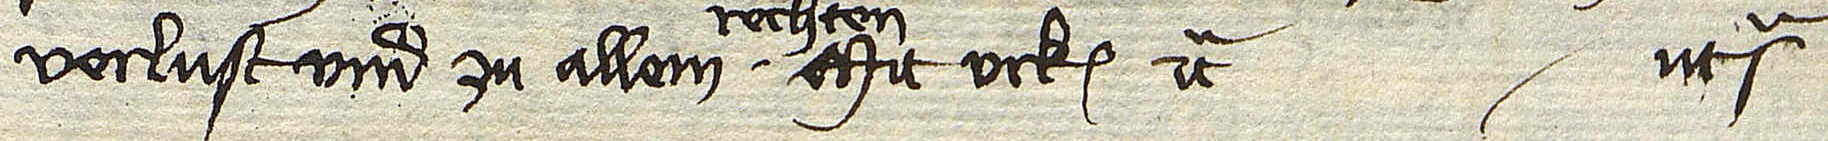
verluſt vnd ʒu allem . Mit vrk* ec* / ut ſ*
